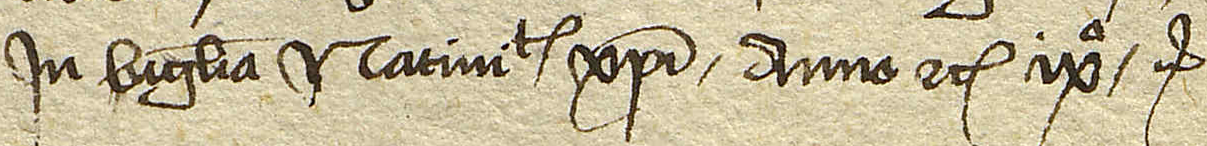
In viglia* Natiui* xpi* / Anno ec* ix* / §
